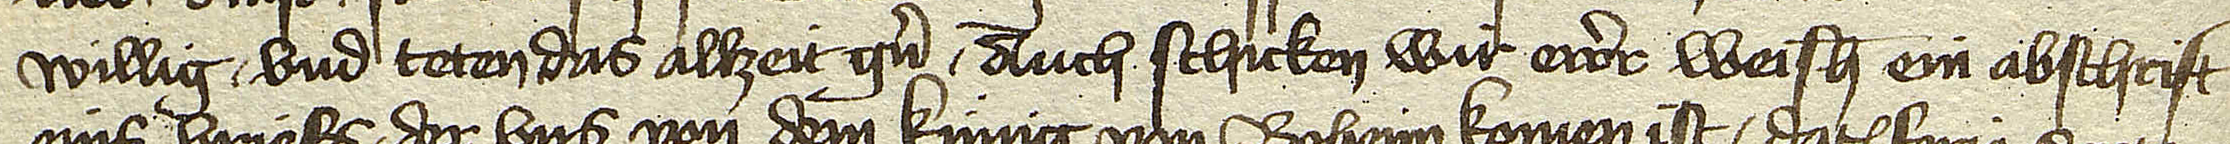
willig / vnd teten das allʒeit gn* / Auch ſchicken wir ew*r weiſh* ein abſchrift
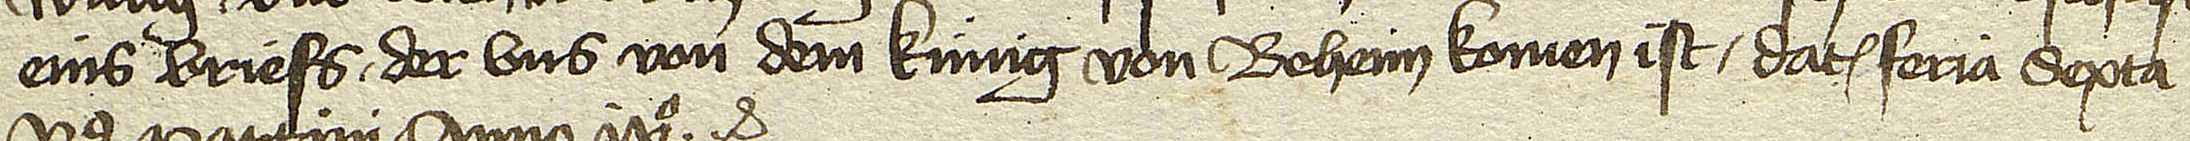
eins briefs / der vns von dem künig von Beheim komen iſt / dat* feria Sexta
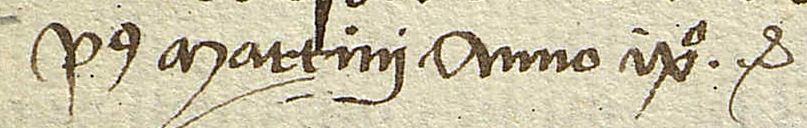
p* Martini Anno ix*. §
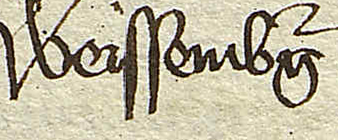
Weiſſemb*g
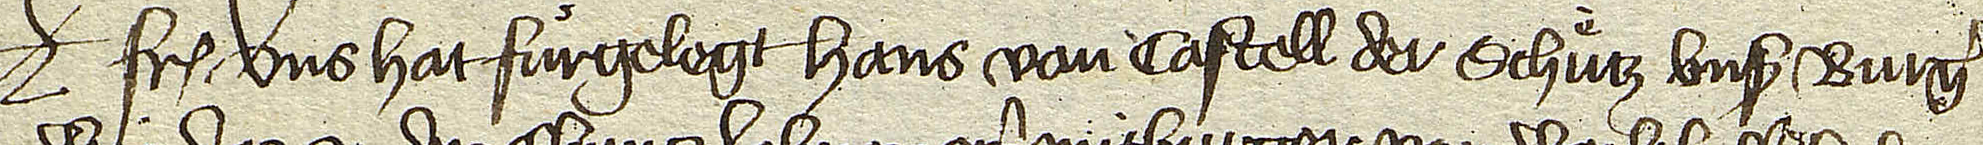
L* fr* / Vns hat fürgelegt hans von Castell der Schücʒ vnſ* Burg*
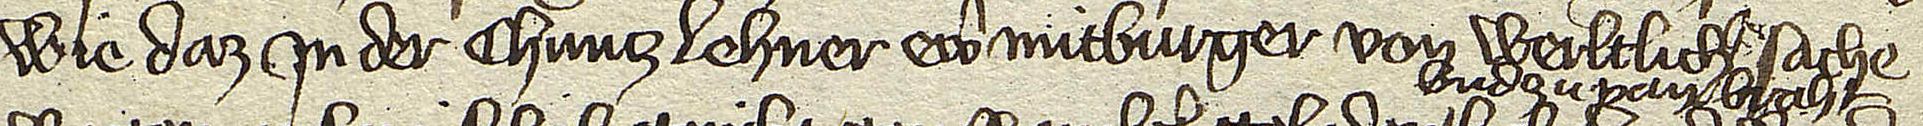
wie daʒ In der Chuncʒ Lehner ew* mitburger von werltlich* ſache
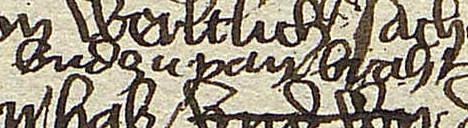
vnd cʒu pan braht
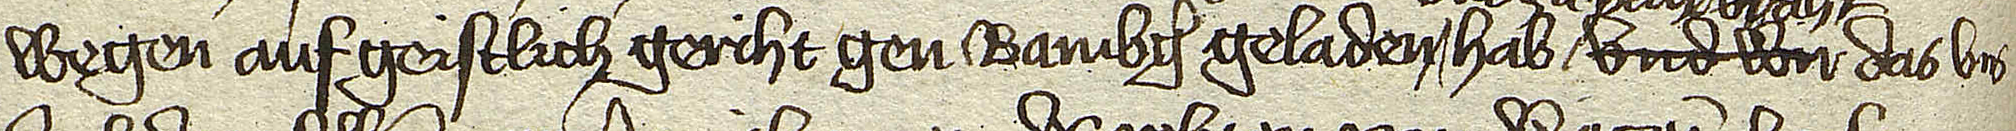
wegen auf geiſtlich geriht gen Bambg* geladen hab / vnd wir das vns
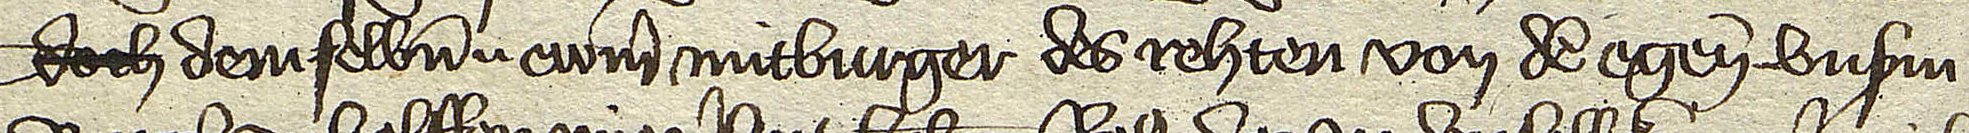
doch demſelbn* ~ ewn* mitburger des rehten von de* egen* vnſ*m
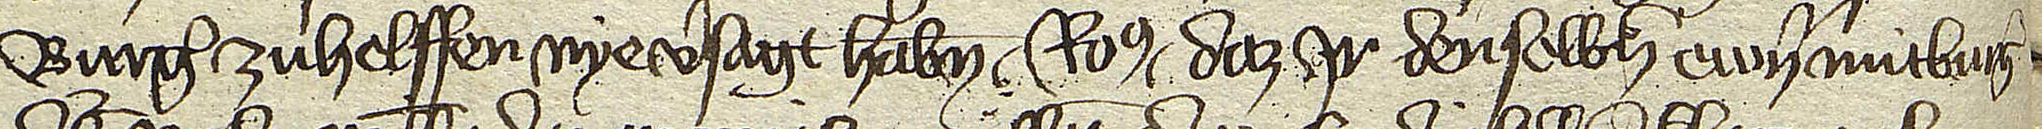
Burg* cʒuhelffen nye v*ſagt habn* / Ro* / daʒ Ir denſelbn* ewn* mitburg*
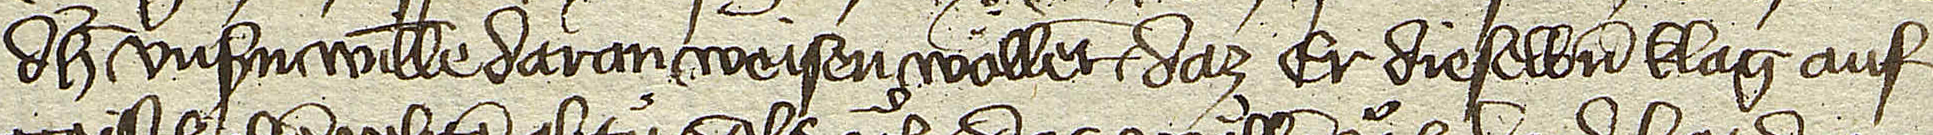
d*h vnſ*n wille daran weiſen wöllet / daʒ Er dieſelbn* klag auf
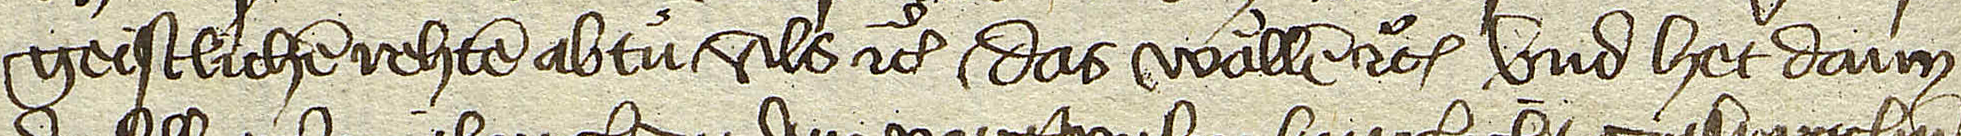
geiſtliche* rehte* abtü / Als ec* / das wölle* ec* vnd het dann
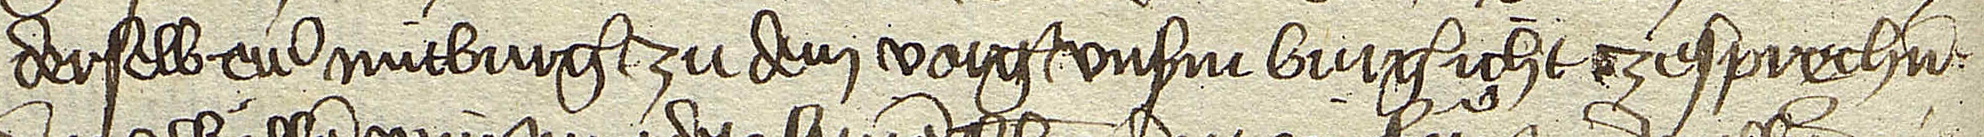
derſelb ew* mitburg* / cʒu dem vorg* vnſ*m burg* icht cʒeſprechn*
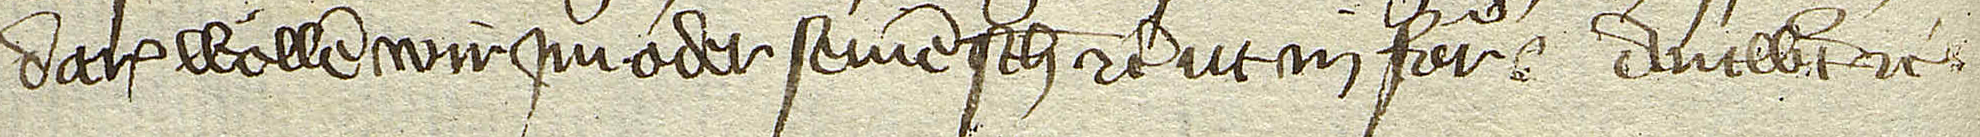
dar* wölle* wir Im oder ſeine* ſch* ec* ut in for* / Antw*t ec*
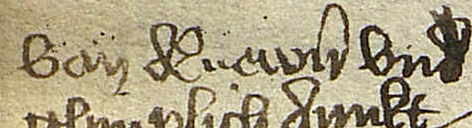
von de* ~ ewr vnd
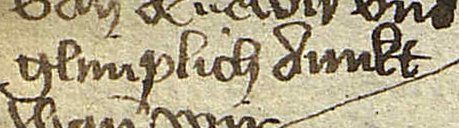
glimplich dunkt
